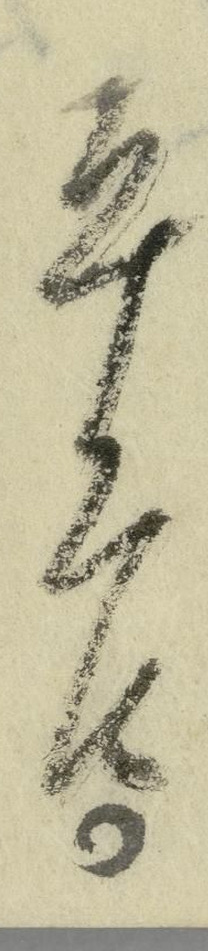文三郎
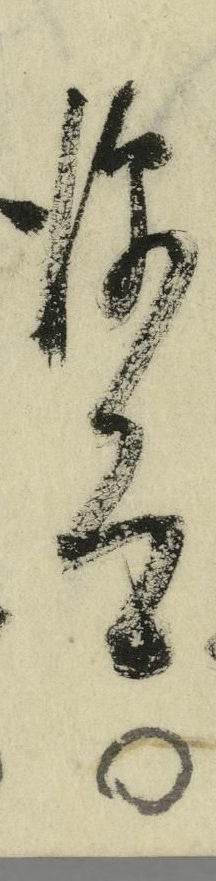十兵衛
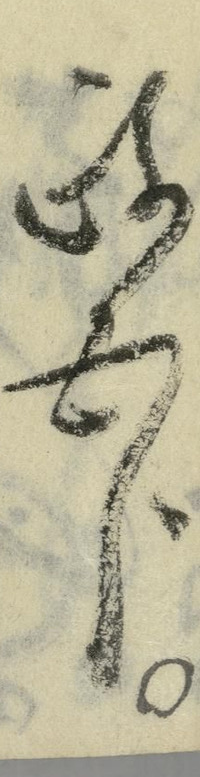政五郎
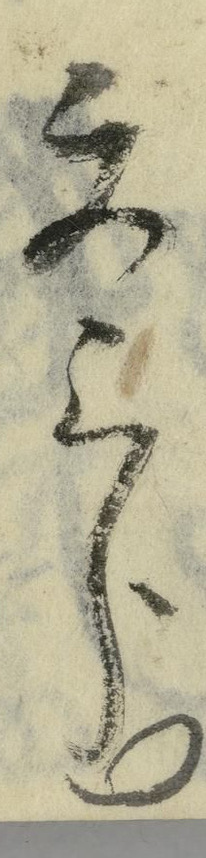文三郎
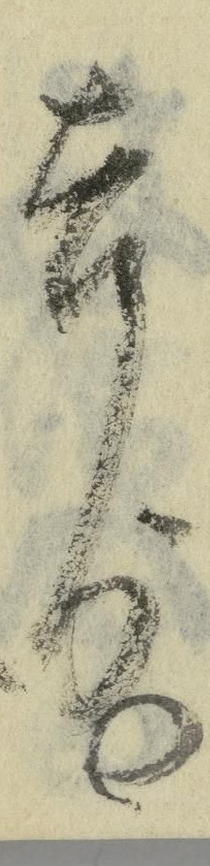十五郎兵衛
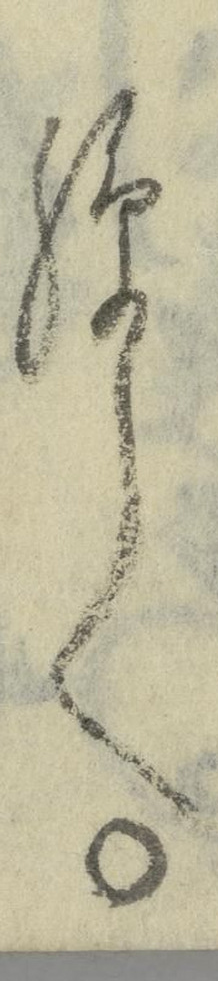吉右衛門
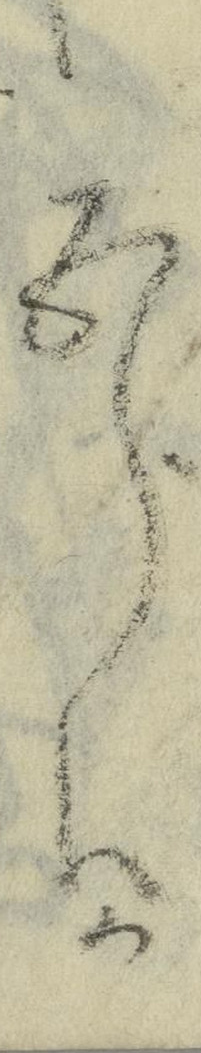政五郎
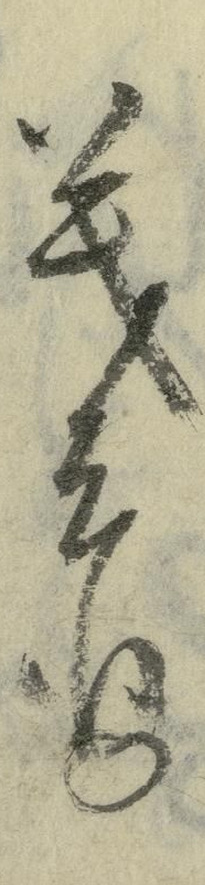十兵衛

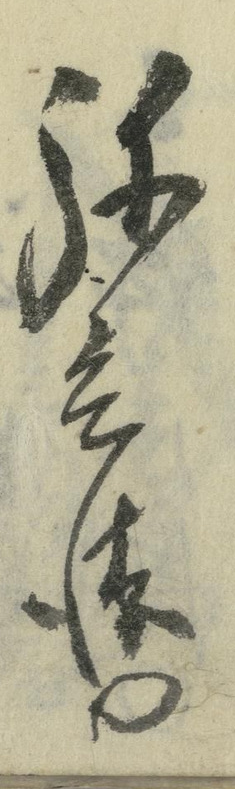弥兵衛
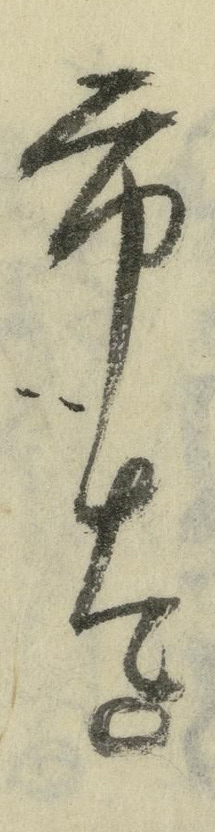安右衛門
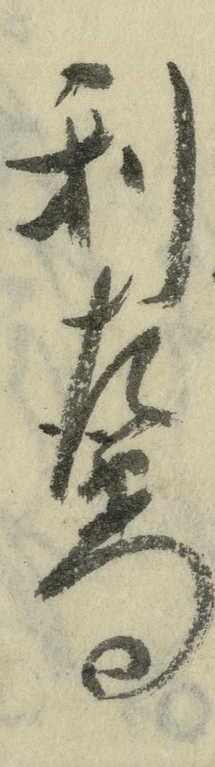利左衛門
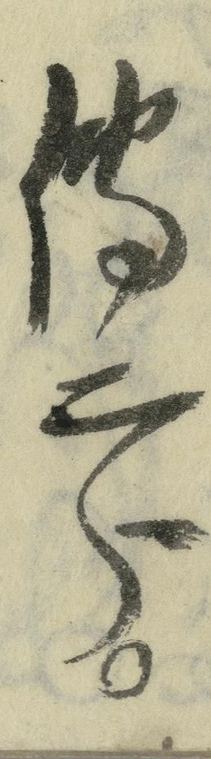伝二郎
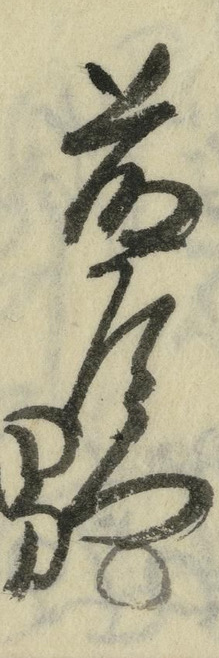藤左衛門
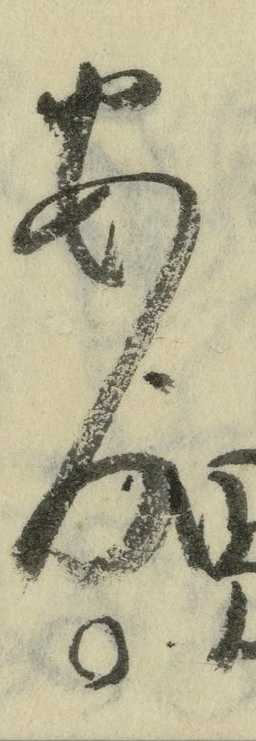安右衛門
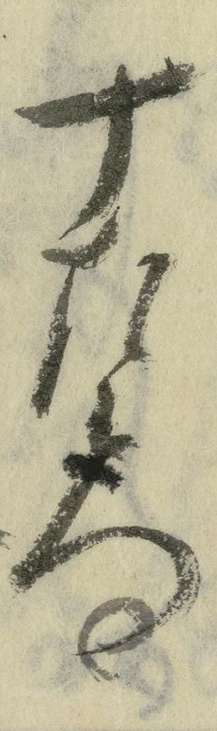十左衛門
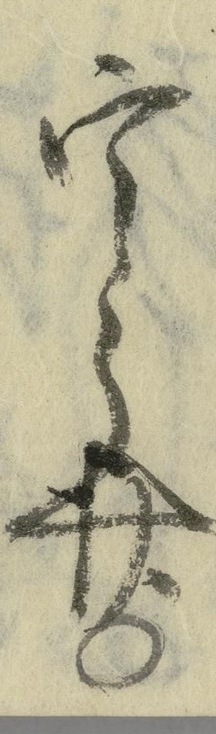宇之介
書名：天明淺間噴火ニ関スル書類
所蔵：東京大学地震研究所図書室 Earthquake Research Institute Library, The University of Tokyo, JAPAN
